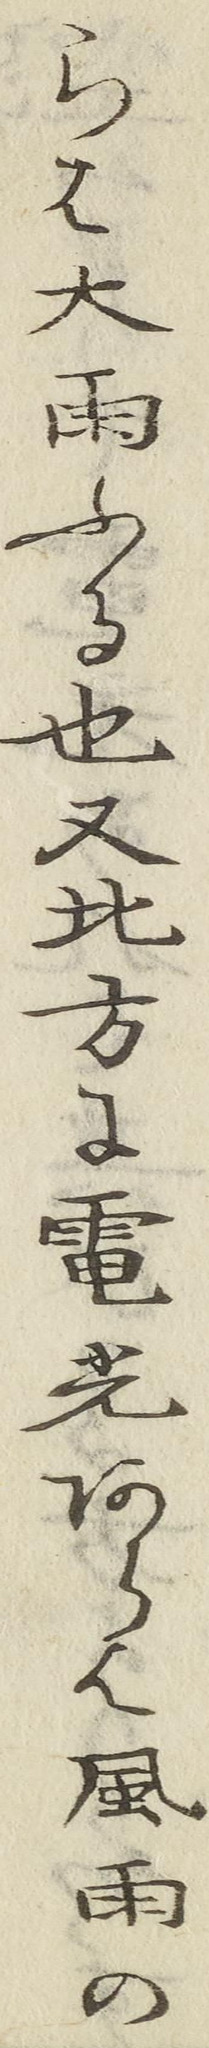らは大雨ふる也又北方に電光あらは風雨の
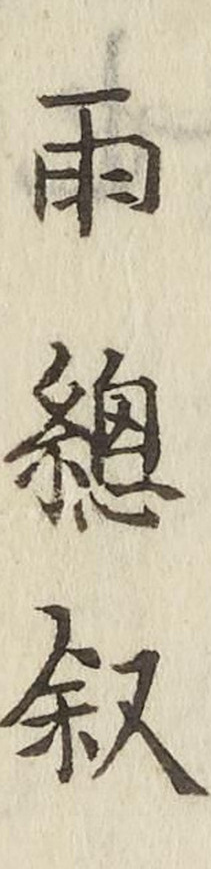雨総叙
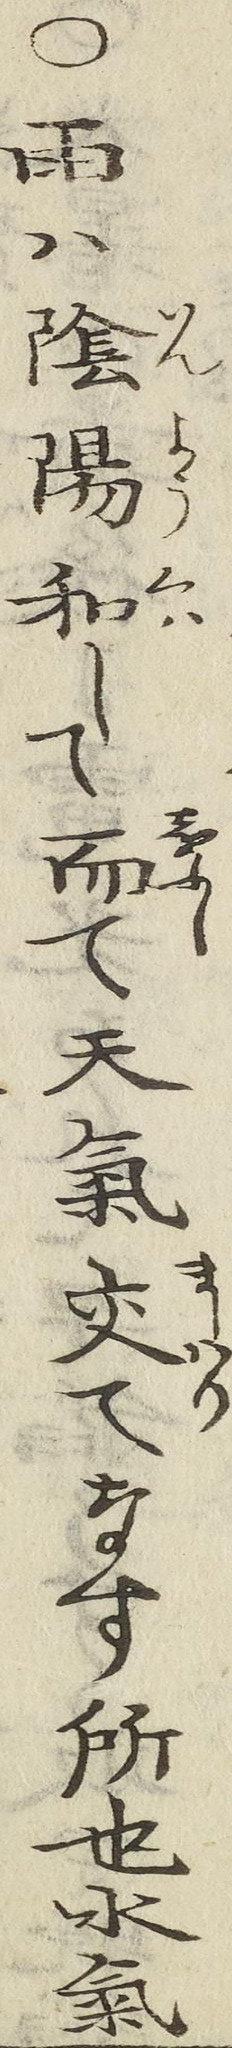○雨は陰陽和して而て天気交てなす所也水気
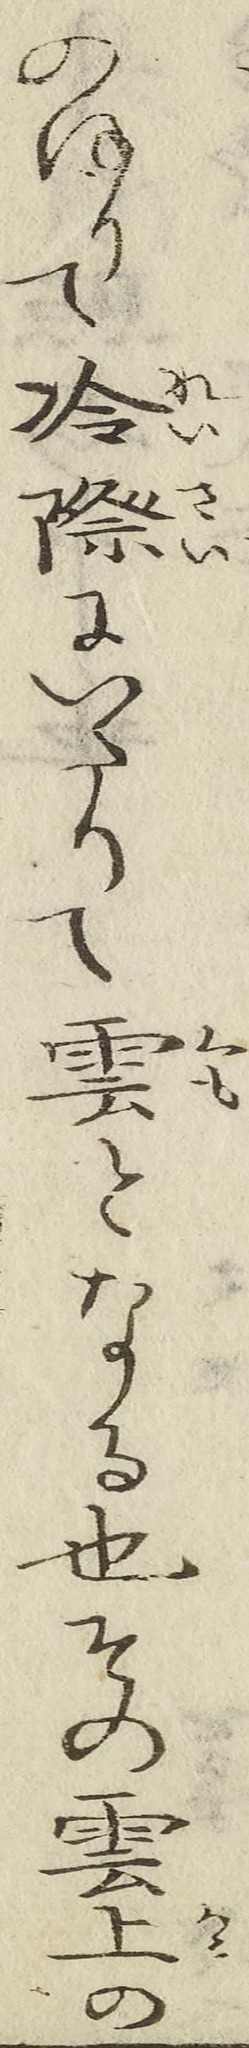のほりて冷際にいたりて雲となる也その雲上の
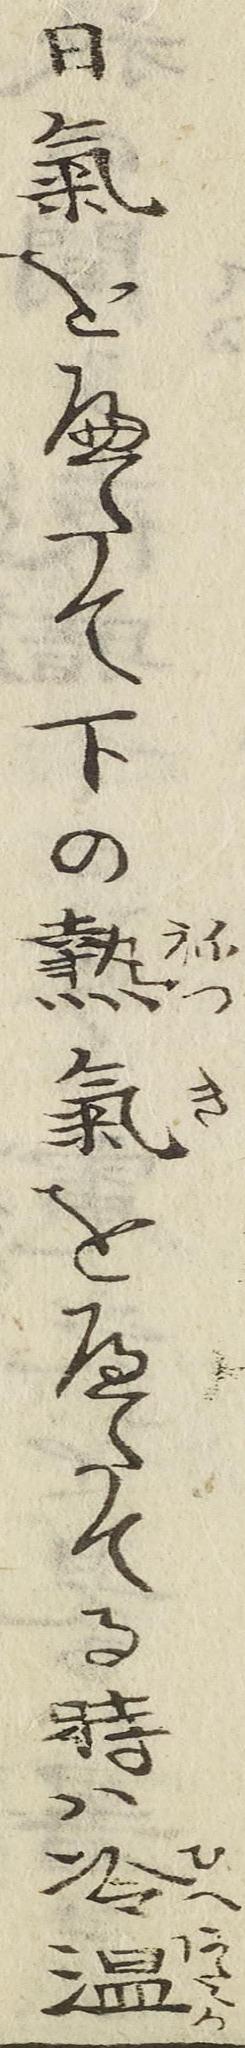日気をへたて下の熱気をへたてる時は冷温
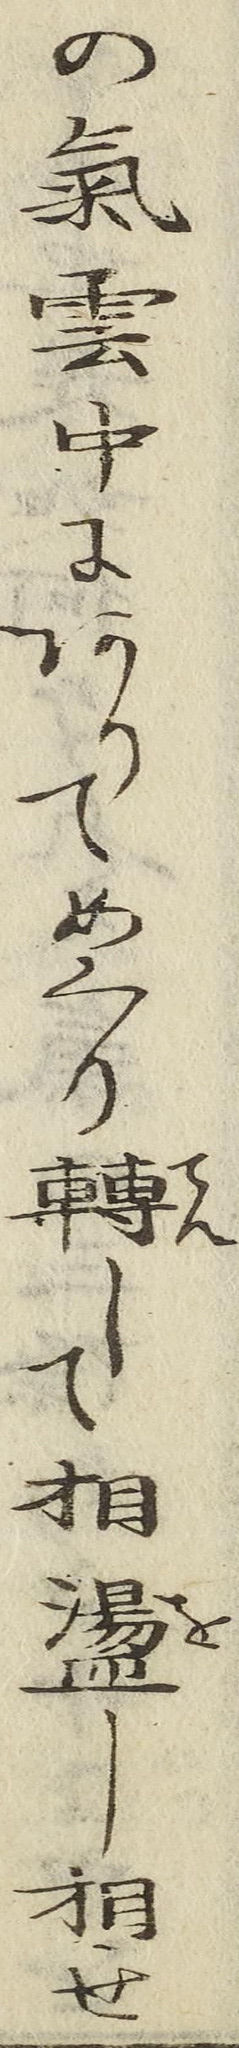の気雲中にありてめくり転して相盪し相せ
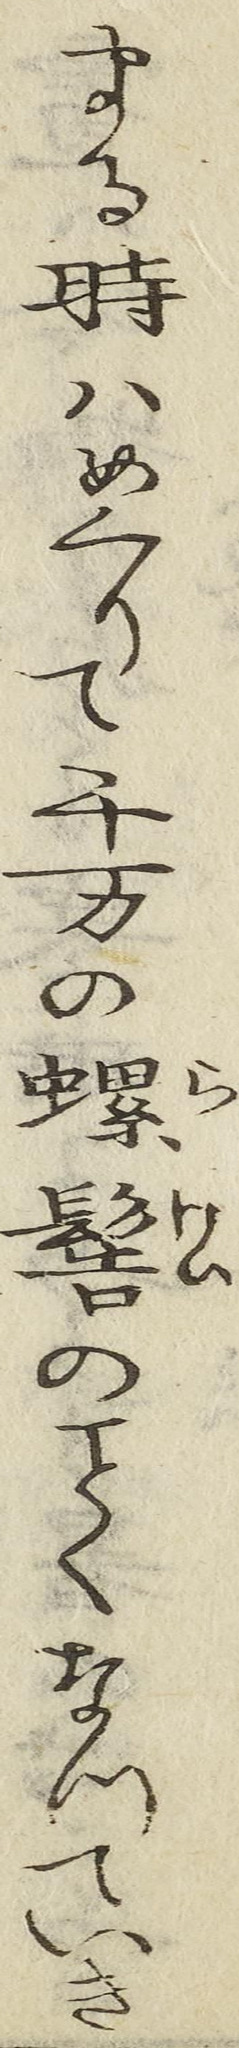まる時はめくりて千万の螺髻のことくなつていき
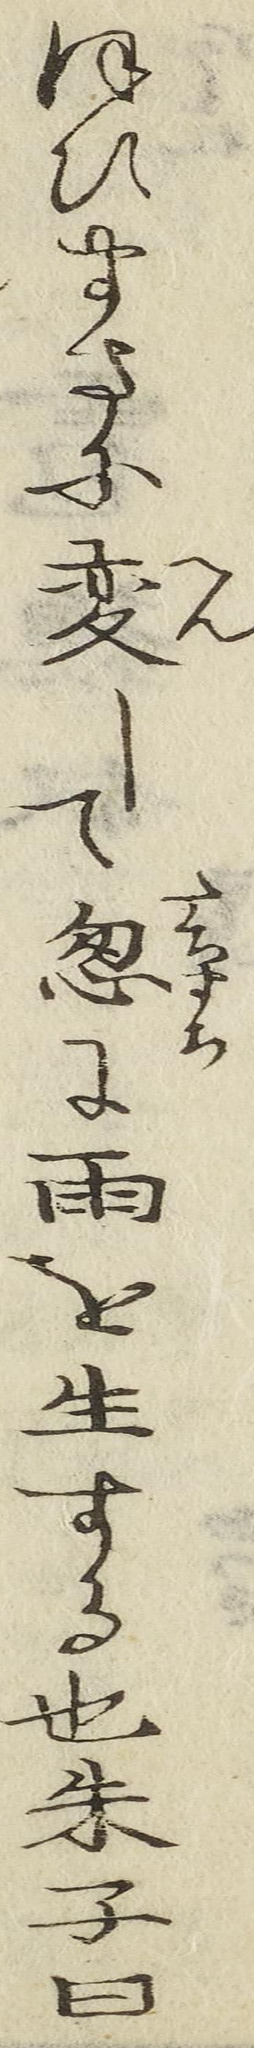ほひますに変して忽に雨を生する也朱子曰
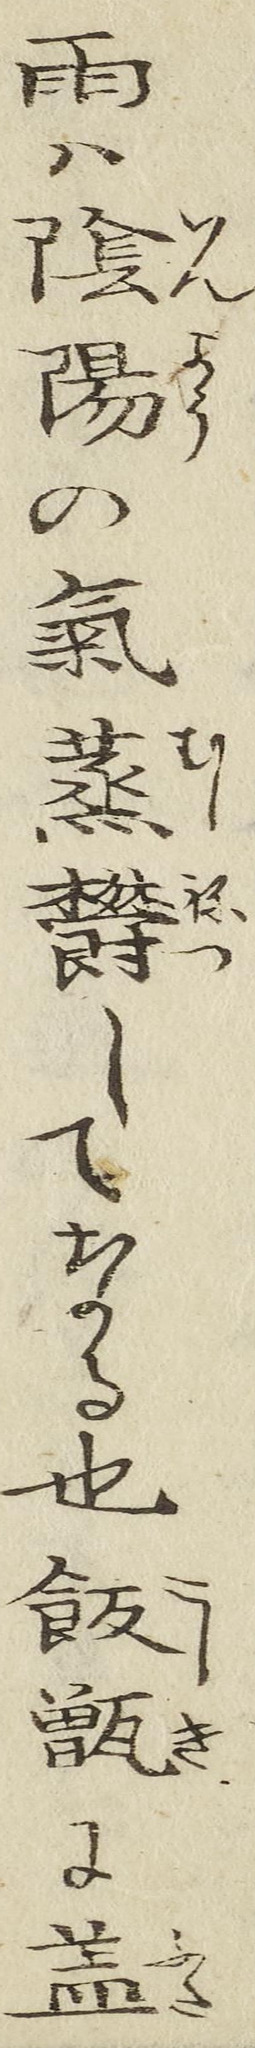雨は陰陽の気蒸欝してなる也飯甑に蓋
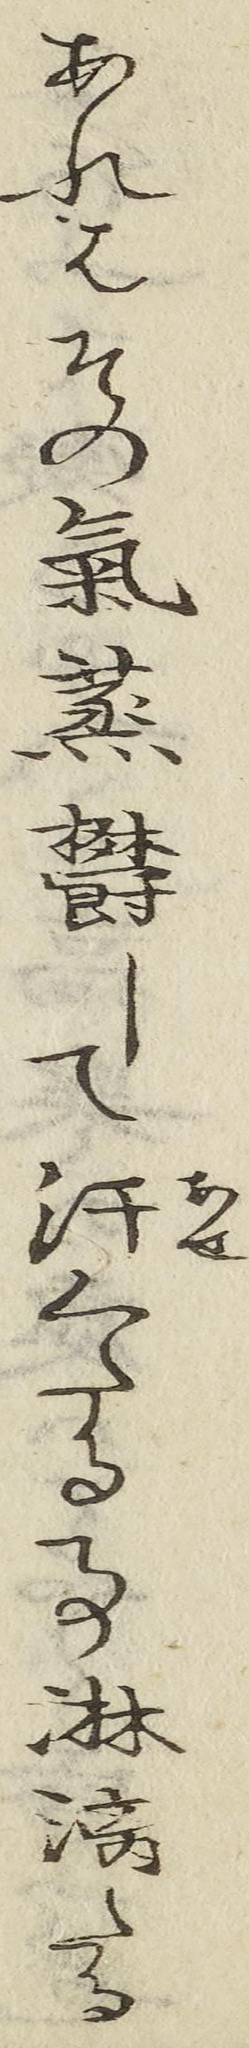あれはその気蒸欝して汗くたる事淋漓たる
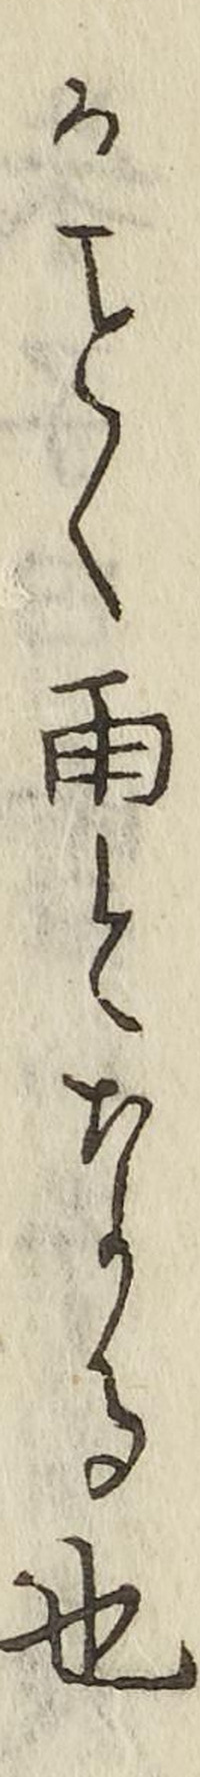かことく雨となる也
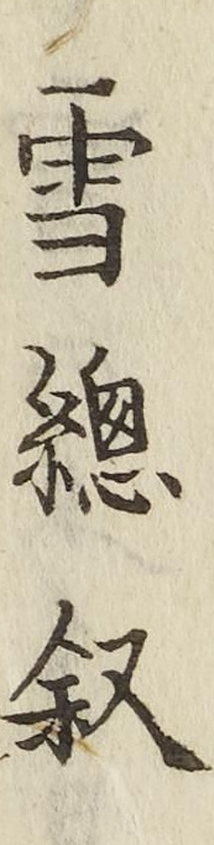雪総叙
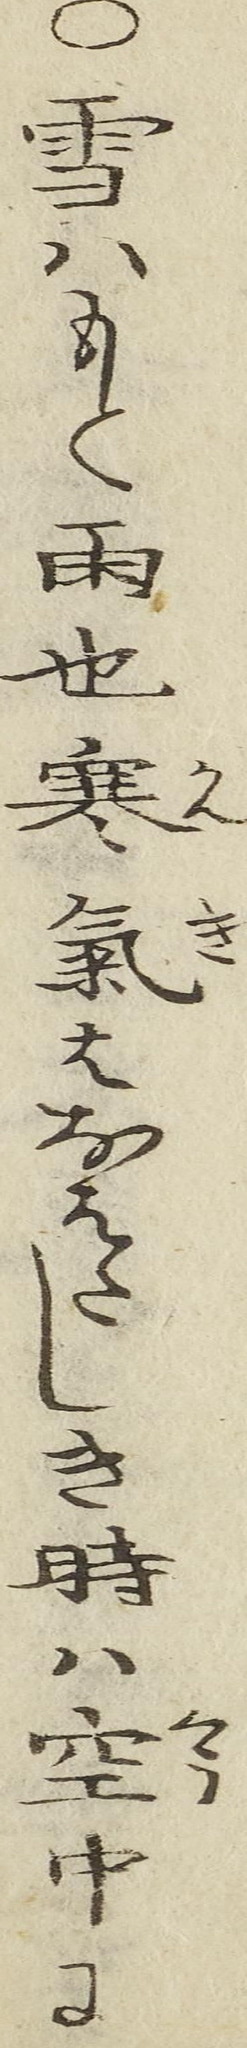○雪はもと雨也寒気はなはたしき時は空中に
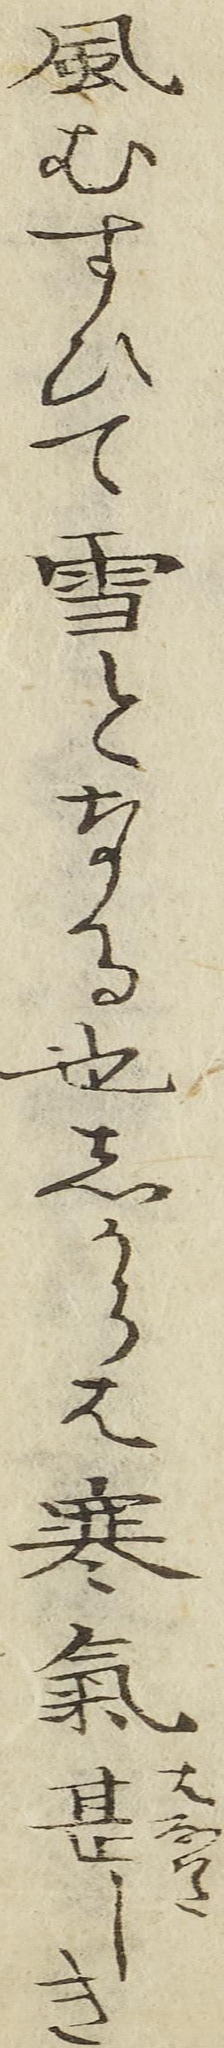風むすひて雪となる也しからは寒気甚しき

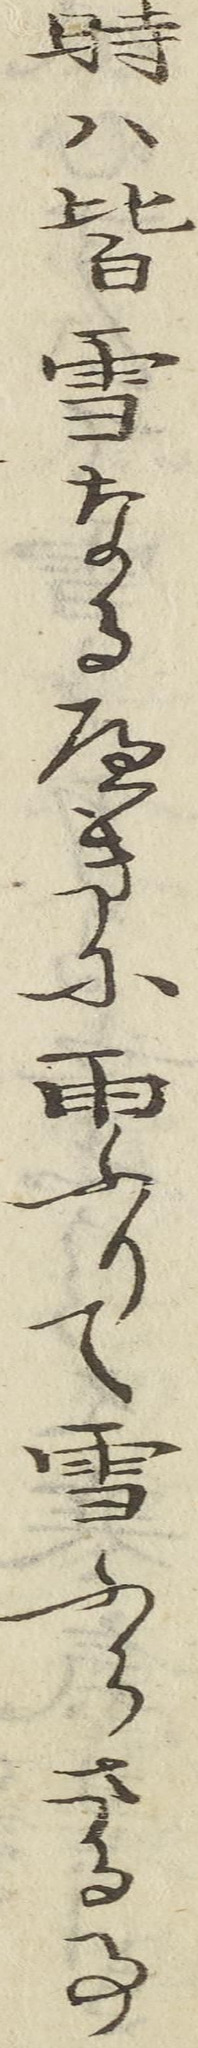時は皆雪なるへきに雨ふりて雪ふらさる事
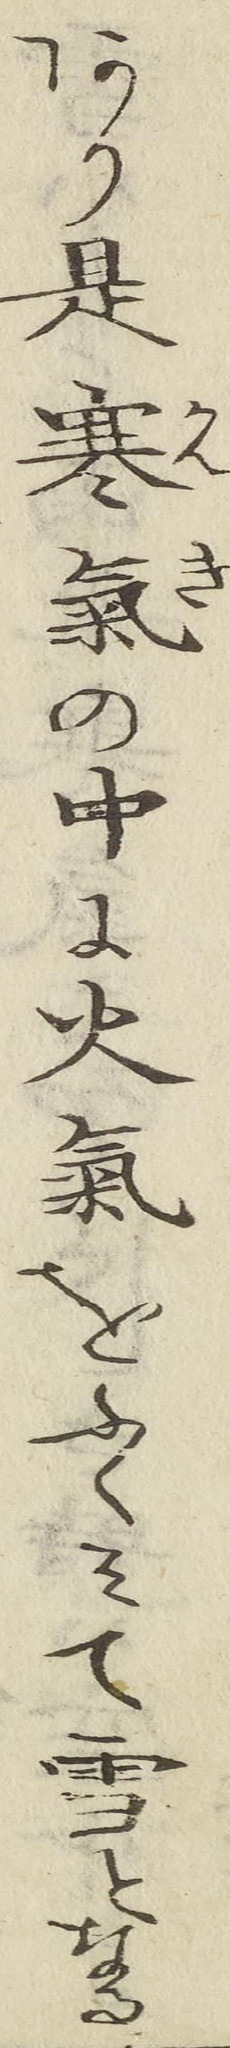あり是寒気の中に火気をふくみて雪となる
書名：天時占候　二
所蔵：東京大学地震研究所図書室 Earthquake Research Institute Library, The University of Tokyo, JAPAN
